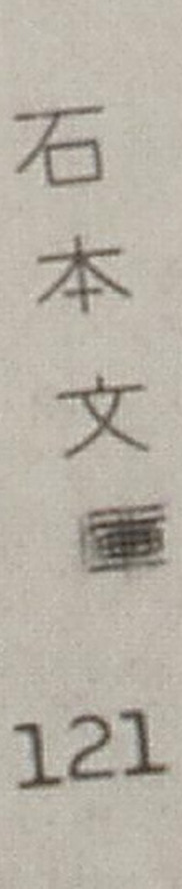石本文庫

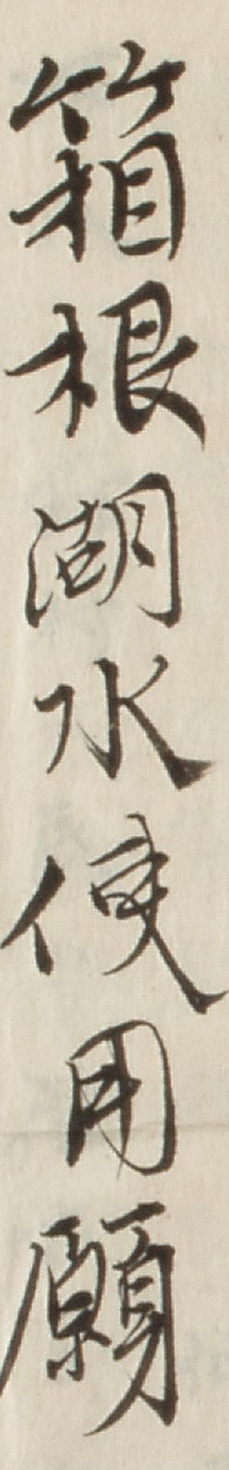箱根湖水使用願
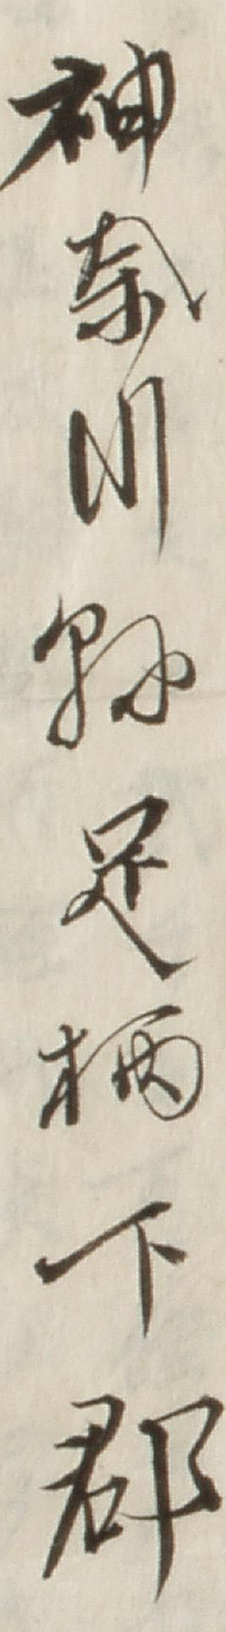神奈川県足柄下郡
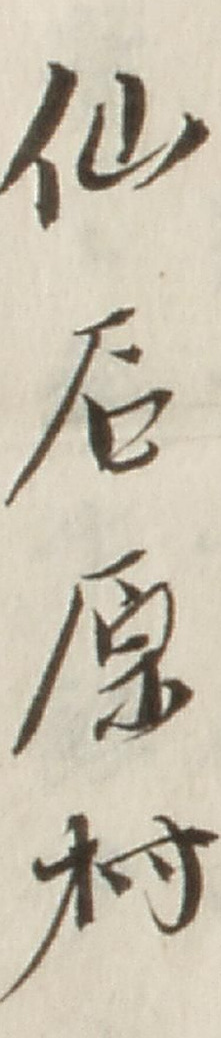仙石原村
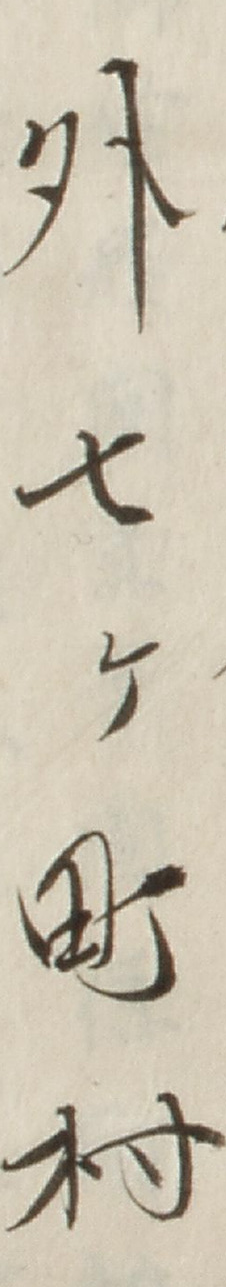外七ヶ町村

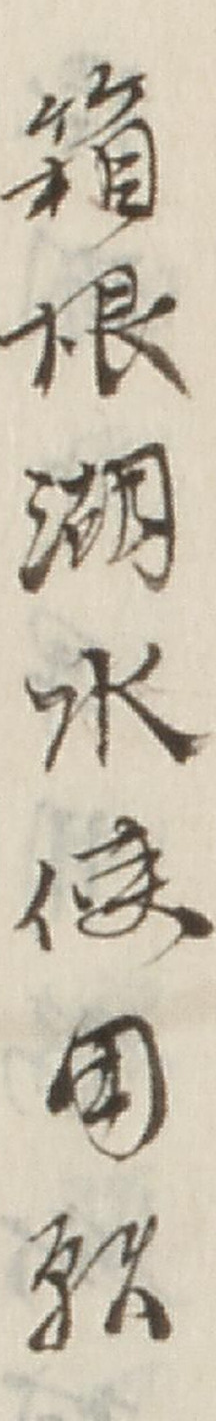箱根湖水使用願
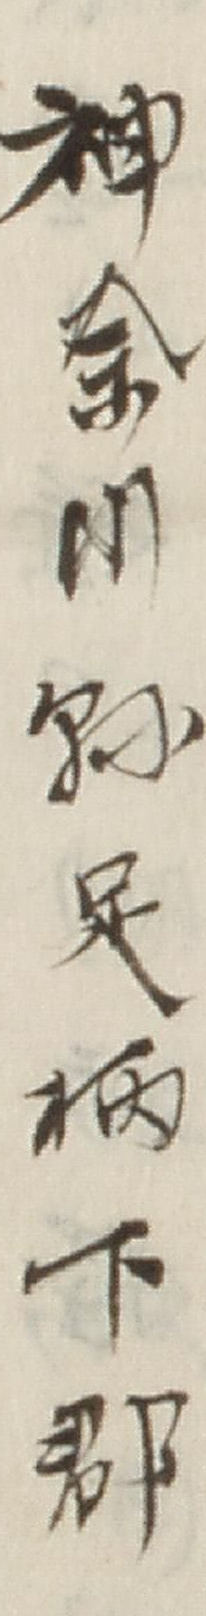神奈川県足柄下郡
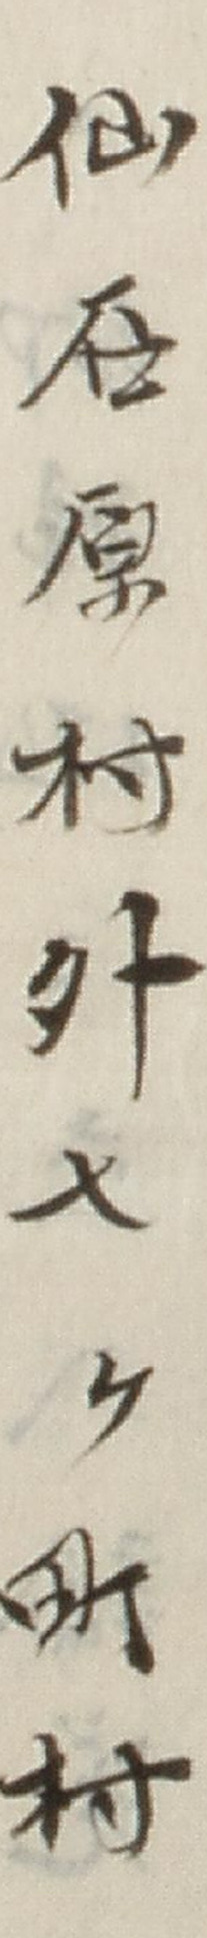仙石原村外七ヶ町村
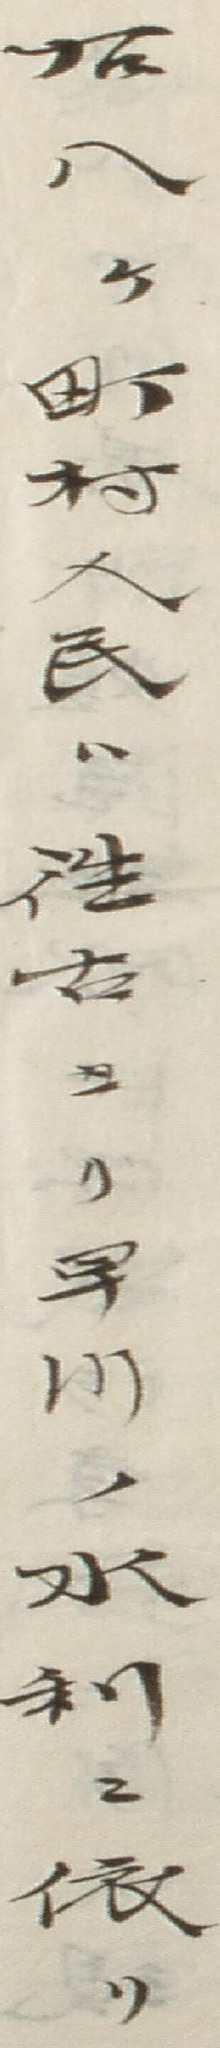右八ヶ町村人民ハ往古ヨリ早川ノ水利ニ依リ
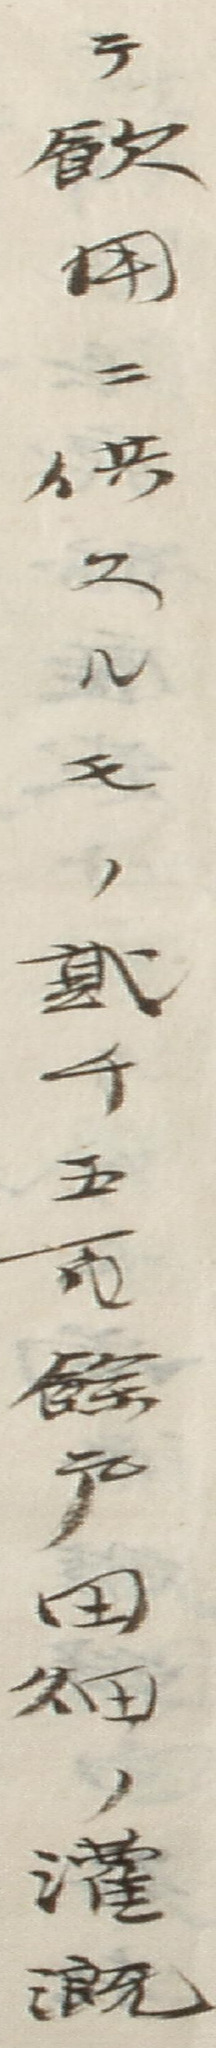テ飲用ニ供スルモノ貮千五百余戸田畑ノ灌漑
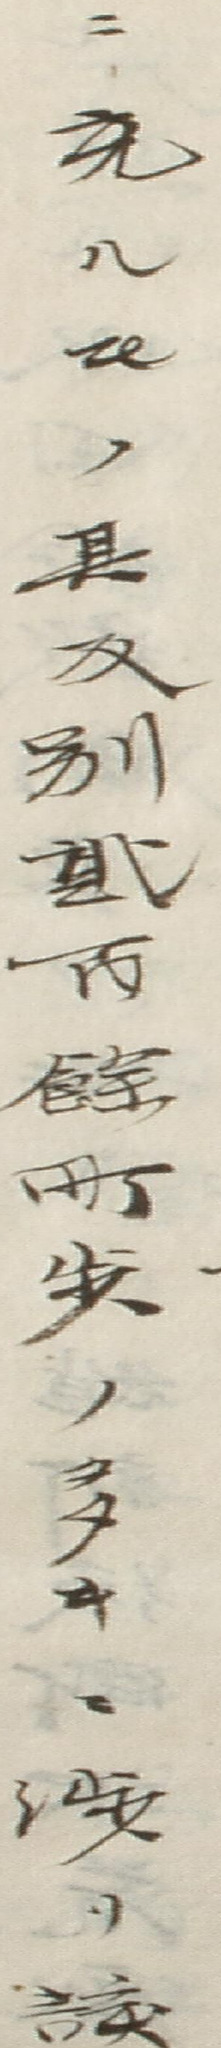ニ充ルモノ其及別貮百余町歩ノ多キニ渉リ該
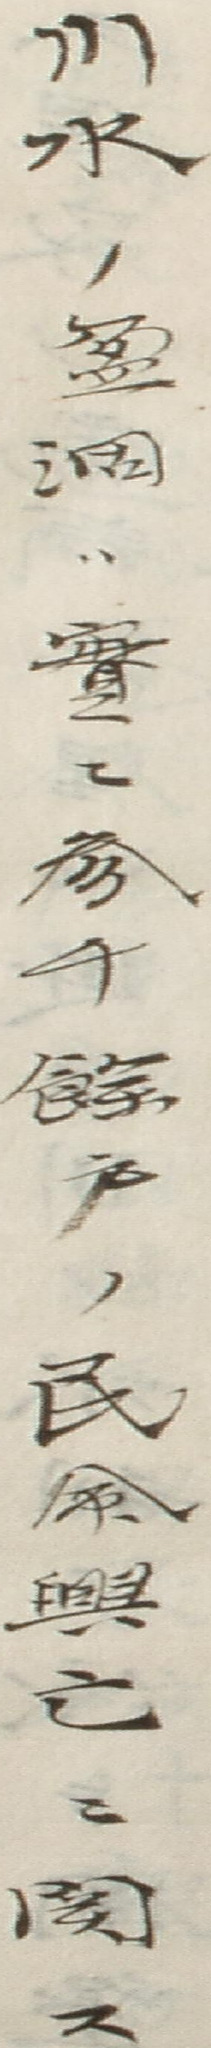川水ノ盈涸ハ実ニ参千余戸ノ民命興亡ニ関ス
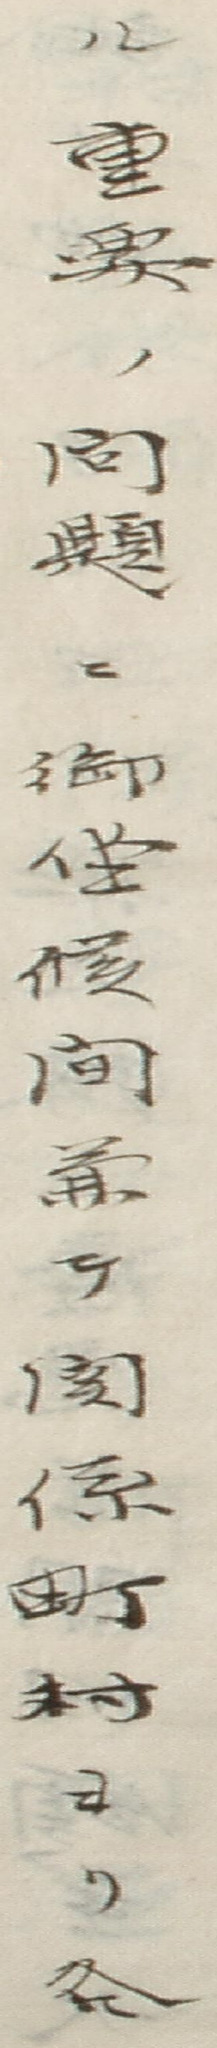ル重要ノ問題ニ御座候問兼テ関係町村ヨリ各
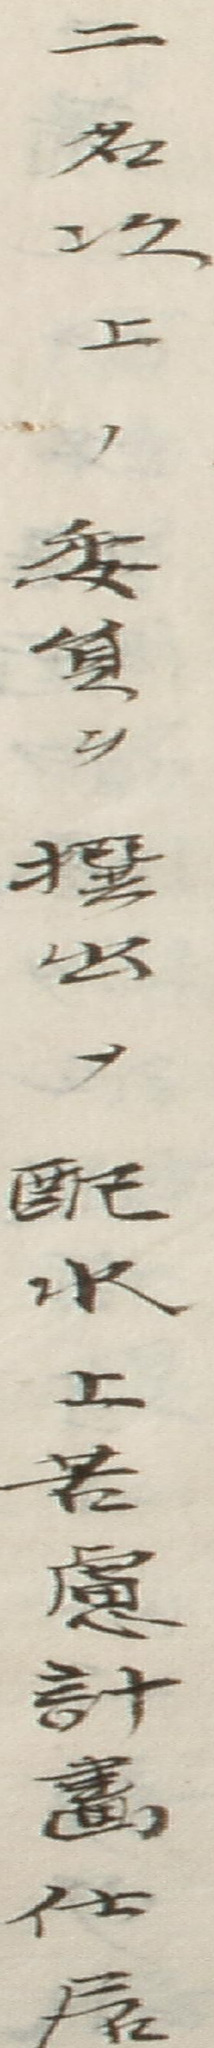二名以上ノ委員ヲ撰出シ配水上苦慮計画仕居
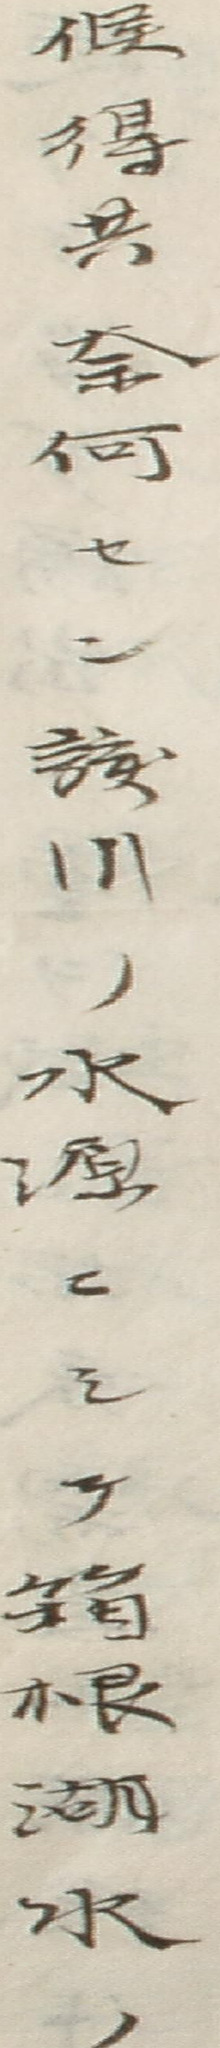候得共奈何セン該川ノ水源ニシテ箱根湖水ノ
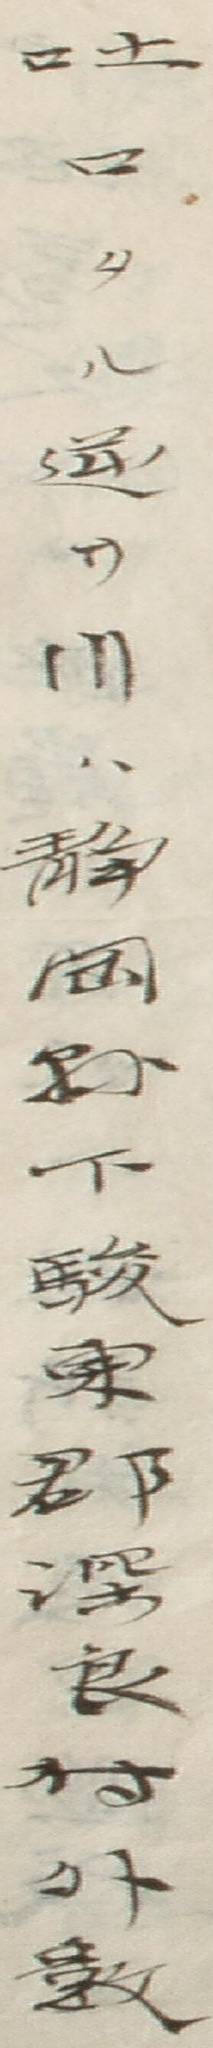吐口タル逆サ川ハ静岡県下駿東郡深良村外数
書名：箱根湖水使用願　神奈川縣足柄下郡仙石原村外七ヶ町村
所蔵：東京大学地震研究所図書室 Earthquake Research Institute Library, The University of Tokyo, JAPAN
